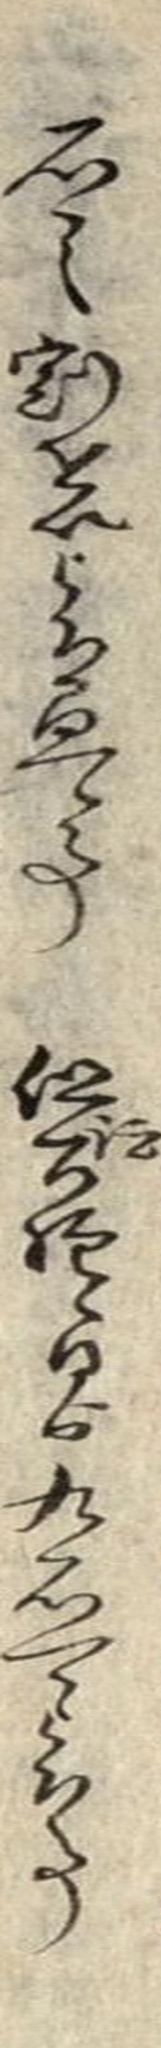石之割を以被下置候事但跡召抱候日ゟ九石可被下事
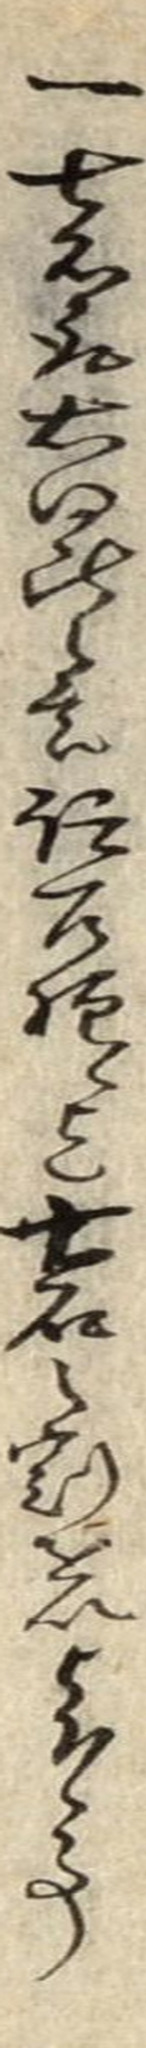一七石取右同断之節跡召抱候迄七石之割を以被下候事
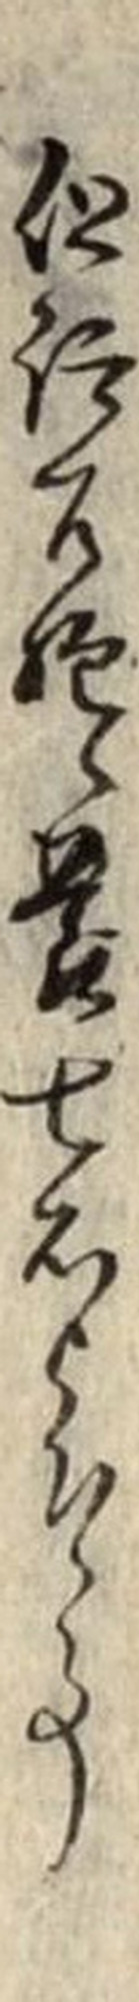但跡召抱候節七石被下候事
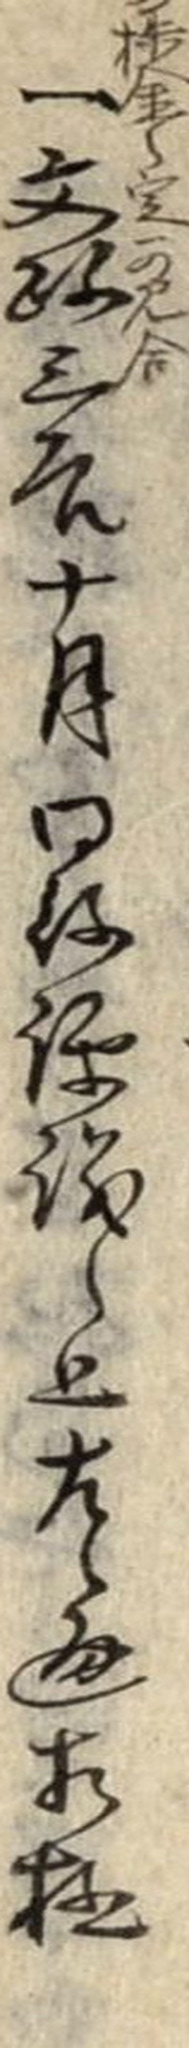一文政三辰十月同役評議之上左之通相極
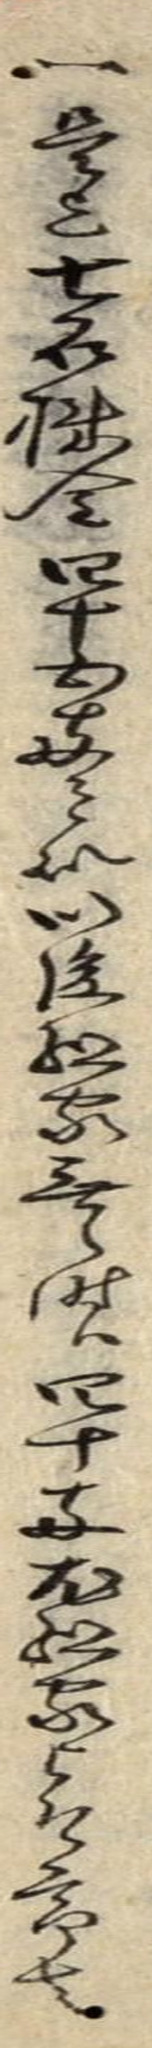一是迄七石株金四十五両に候処以後組家無之時は四十両尤組家被下候節は

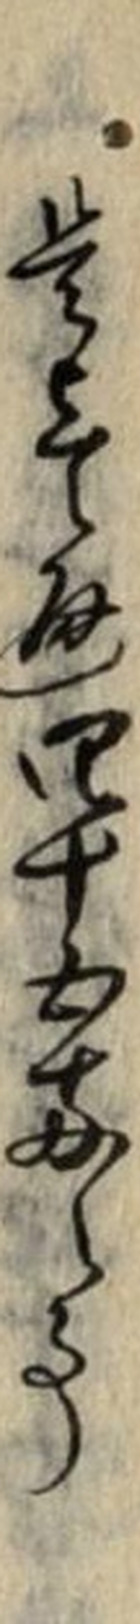是迄之通四十五両之事
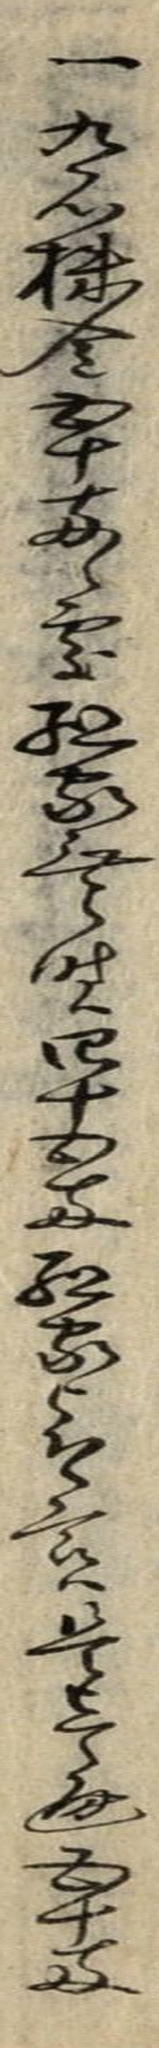一九石株金五十両之処組家無之時は四十五両組家被下候節は是迄之通五十両
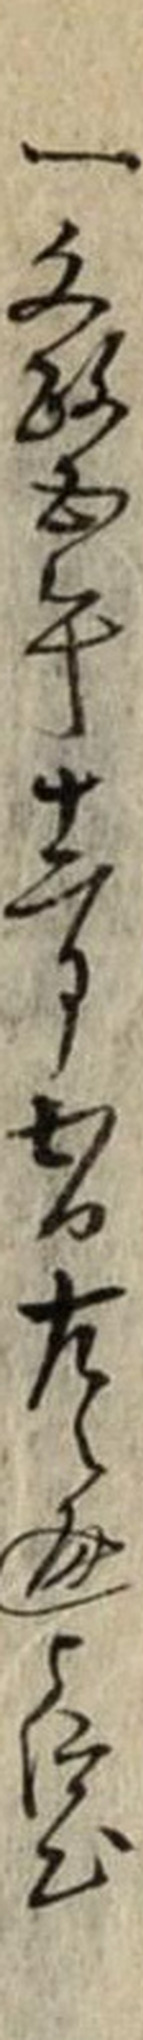一文政五午十二月五日左之通被仰出
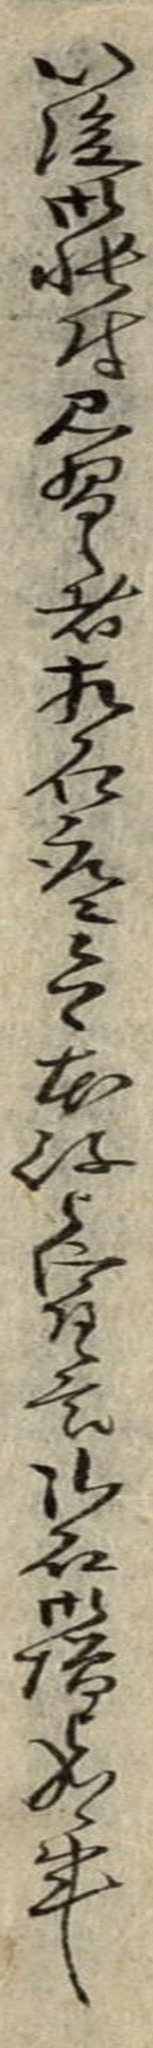以後御帳付見習之者拾石取に候はゝ本役被仰付候節弐石お御増被成候事
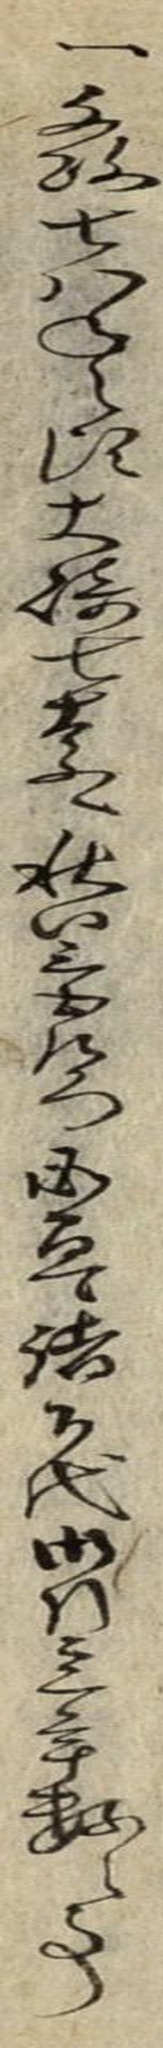一文政七八年之頃大崎七太夫へ秋田三五左衛門承置候下代御引立年数之事
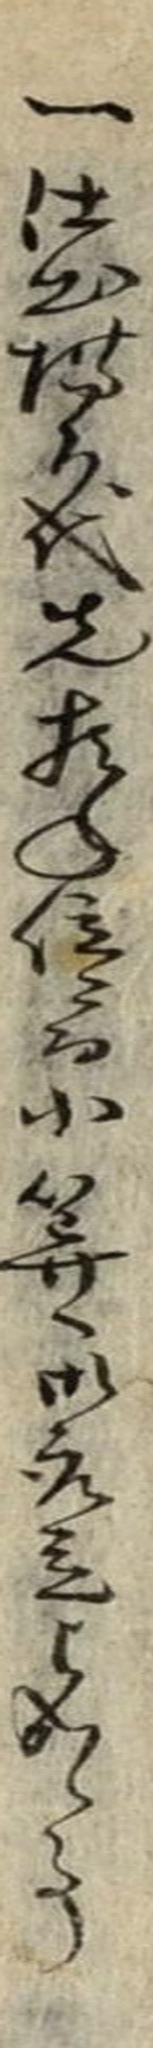一仕出場下代先拾年位に而小算へ御取立被成候事
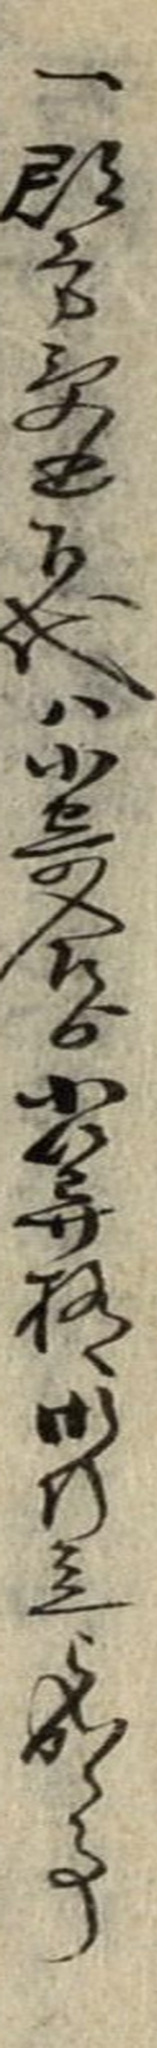一郡方受込下代は小寄合ゟ小算格へ御引立被成候事
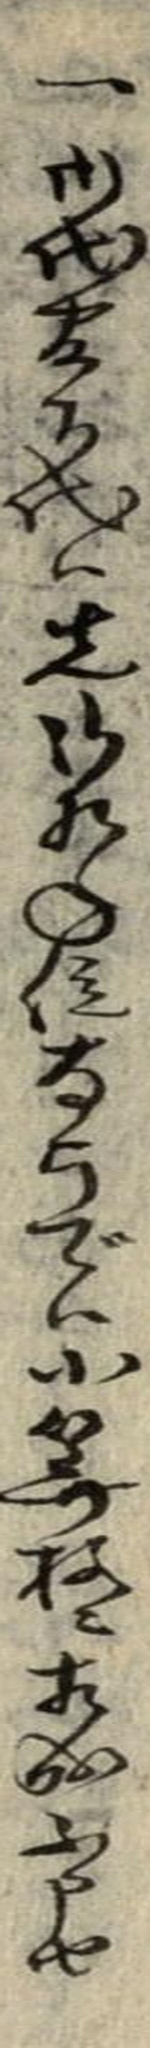一御代官下代は先弐拾年位ならでは小算に相成不申候由
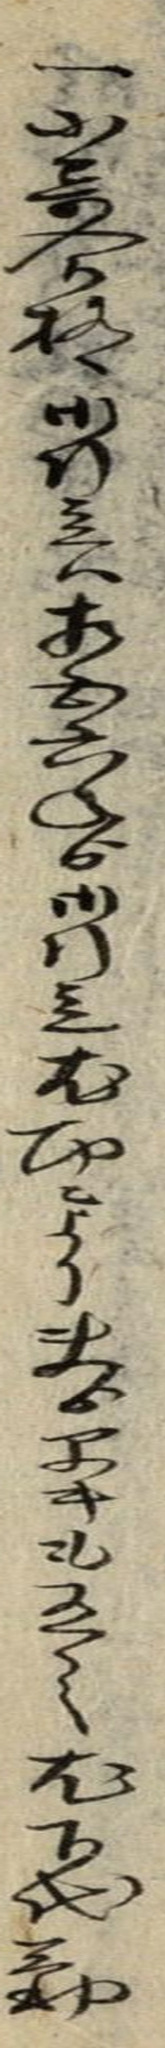一小寄合格へ御引立は拾五六年ゟ御引立尤切により夫ゟ早きも有之尤下代勤
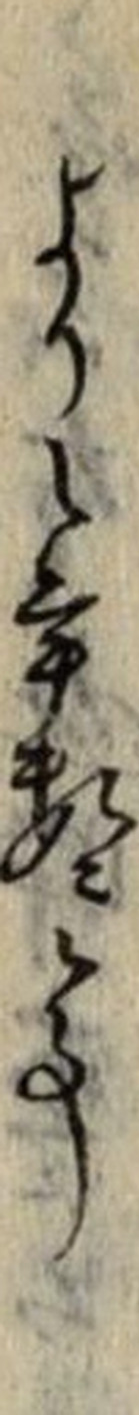より之年数候事
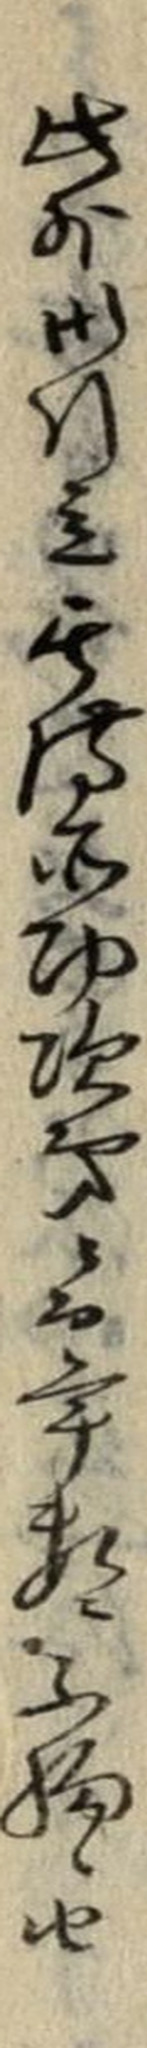此外御引立其場所切次第に而年数に不拘候由
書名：御用并被仰出之部
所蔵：福井県文書館 Fukui Prefectural Archives
